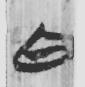白
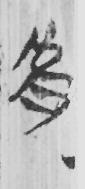兔
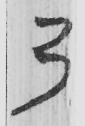乃
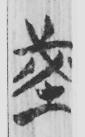{必土}
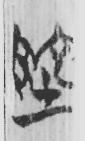地（地）
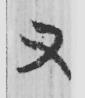又
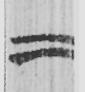二
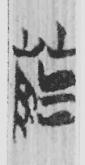{艹阝仌}（陵）
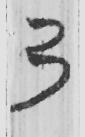乃
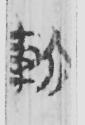斬
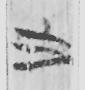之
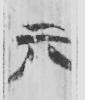亓
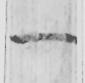一
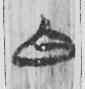白
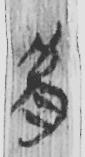兔
